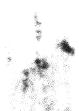少
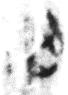則（則）
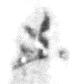之
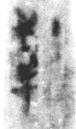新
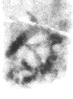齊（劑）
